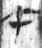午
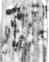是
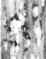胃（謂）
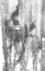秀（禾）
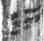日
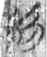利（利）
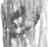㠯（以）
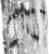大
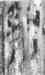祭
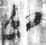㠯（以）
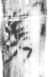○（冠）
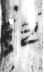車
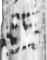馬
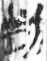折（製）
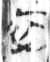衣
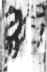○（裳）
